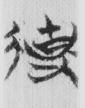𫹒
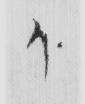人
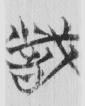{小言戈}
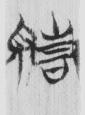{見青}
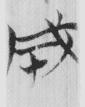成
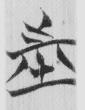市
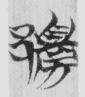{臱阝}
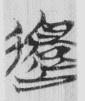還
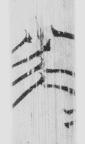少大=
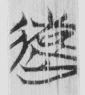遠
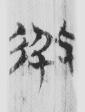{彳尼}
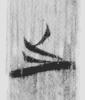之
